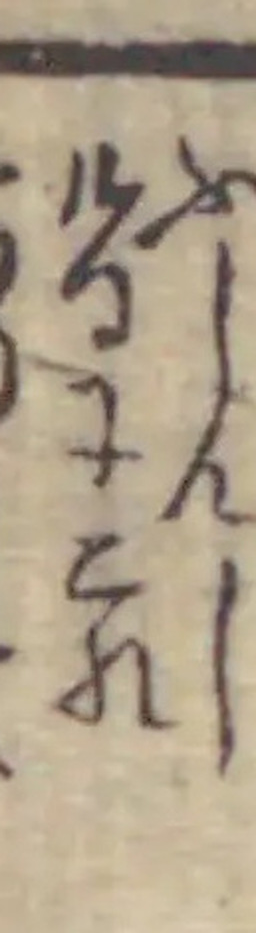けるにこれ
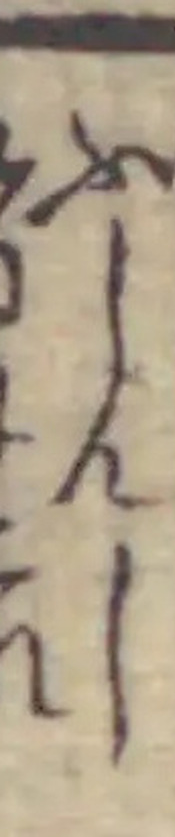ふしんし
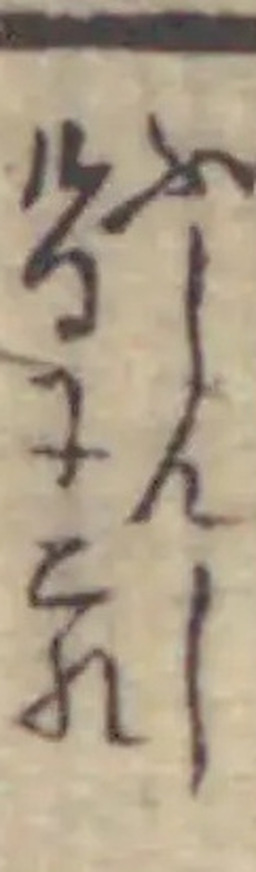けるにこれ
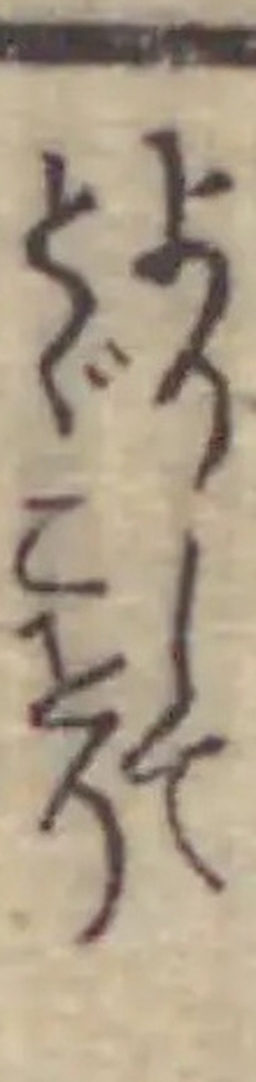とゞこをり
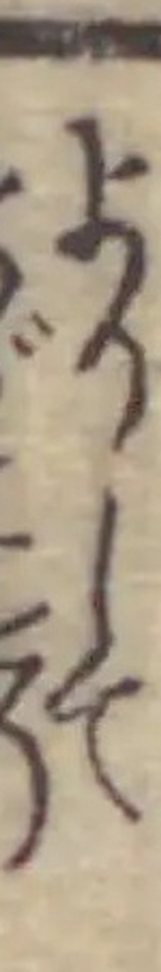よりして
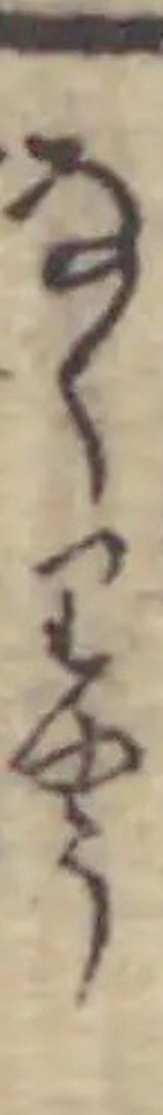なくりやう
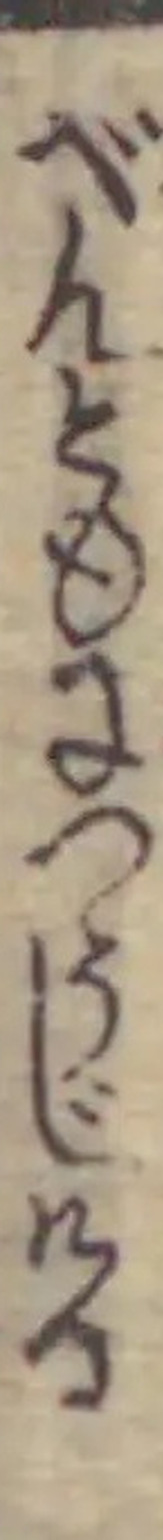べんともにつうじける
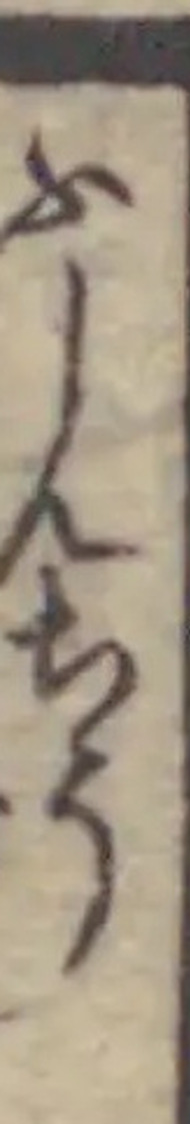ふしんちう
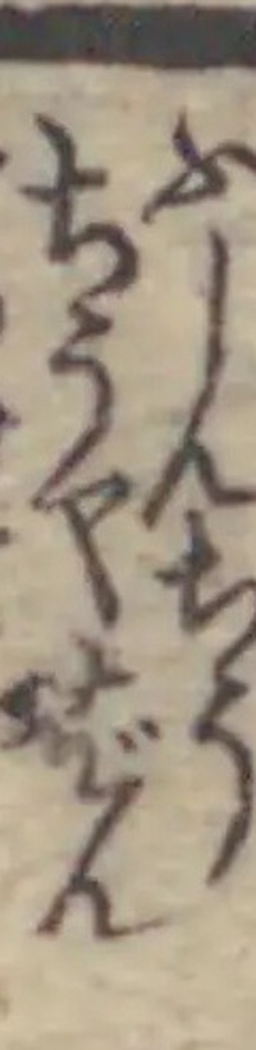ちうやばん
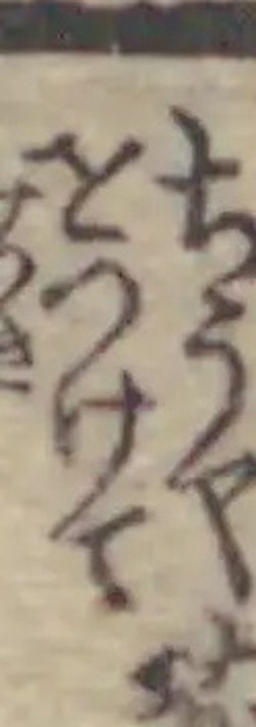をつけて
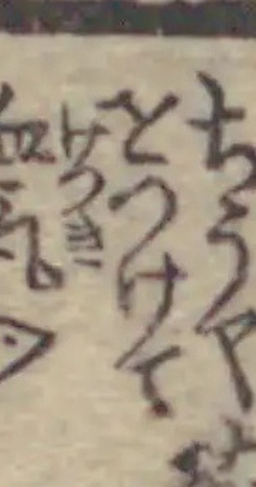をつけて
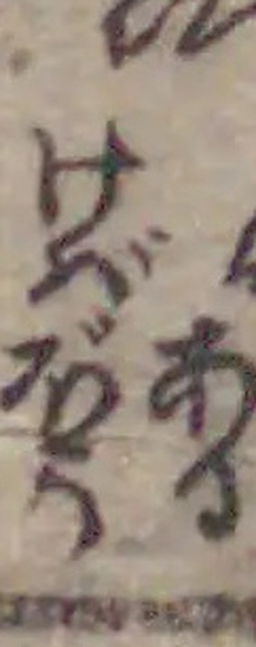けばぼう
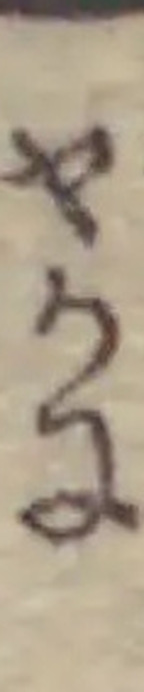やかに
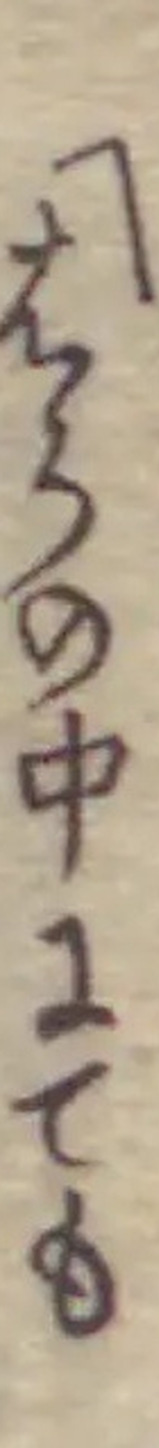〽はらの中にても
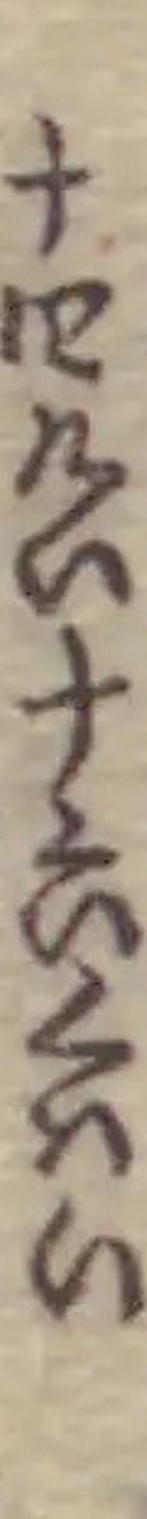十四けい十六くはい
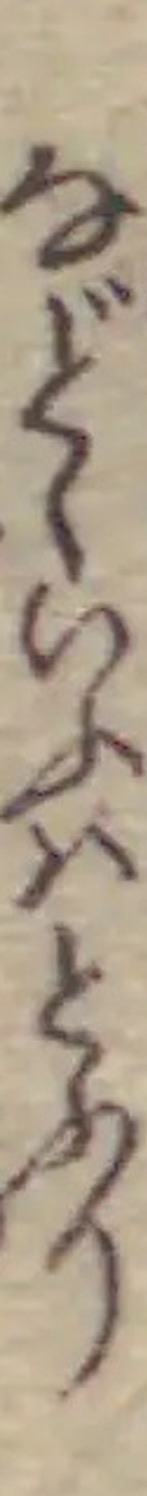などゝいふはとふり
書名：腹内養生主論 3巻
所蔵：国立国会図書館 National Diet Library, JAPAN
